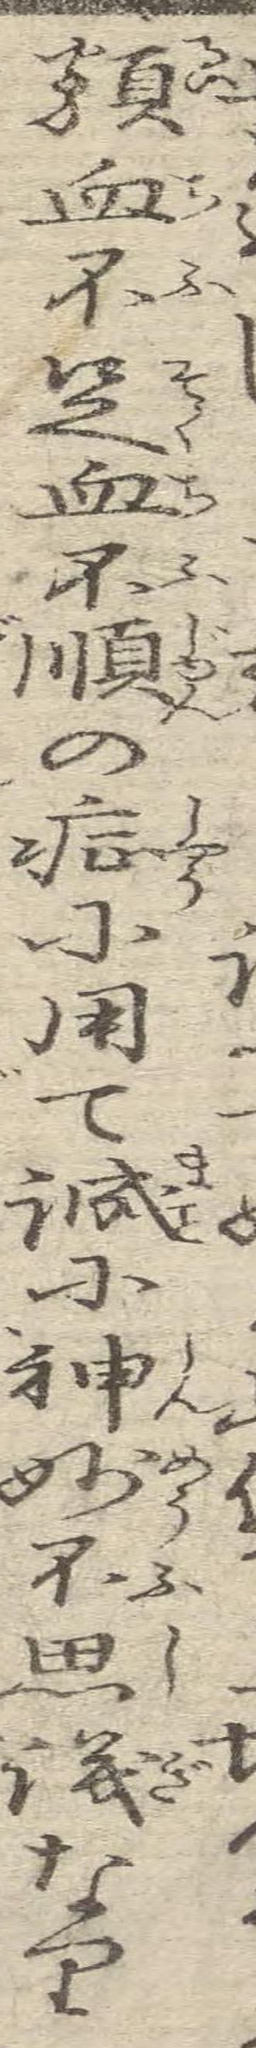類血不足血不順の症に用て誠に神妙不思議なり
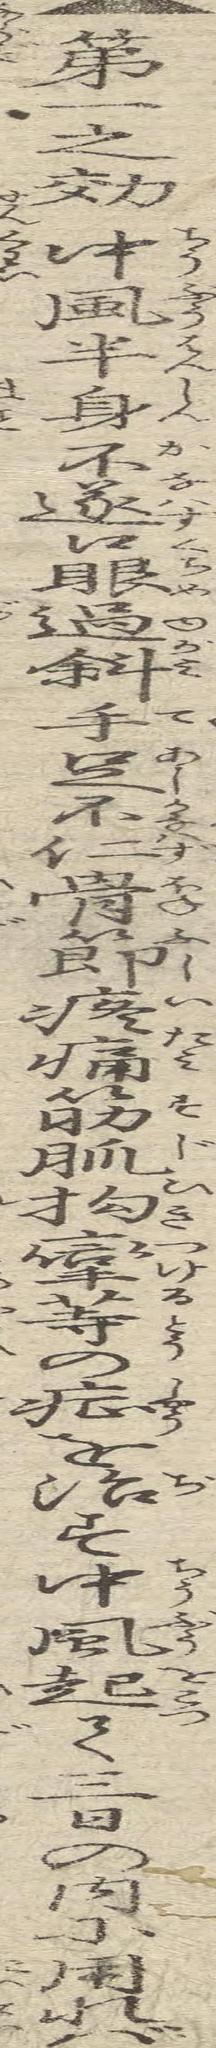▲第一之効中風半身不遂口眼過斜手足不仁骨節疼痛筋脈拘攣等の症を治す中風起て三日の内に用れば
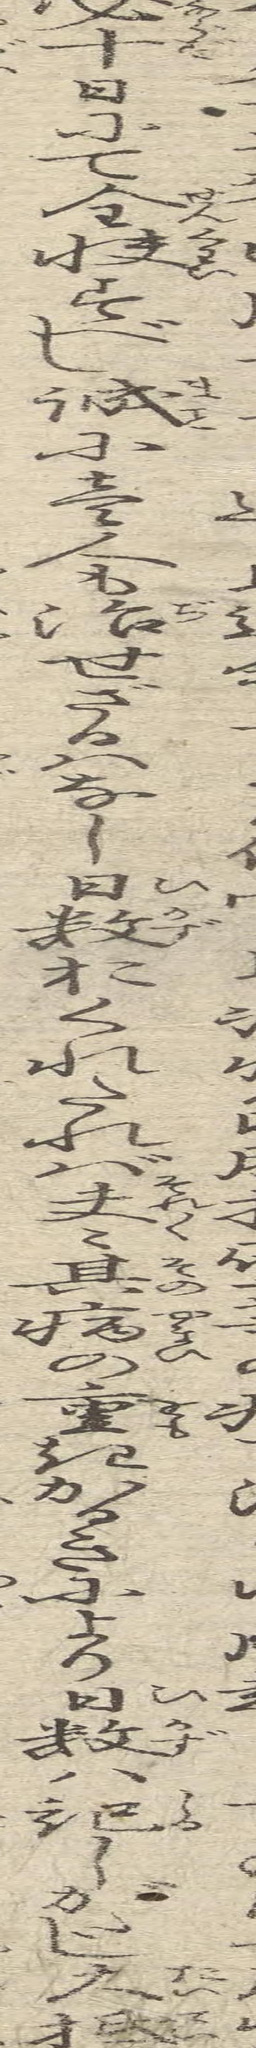必十日にて全快すべし誠に壱人も治せざるはなし日数おくれたれば夫々其病の重きかるきにより日数は記しがたし大抵
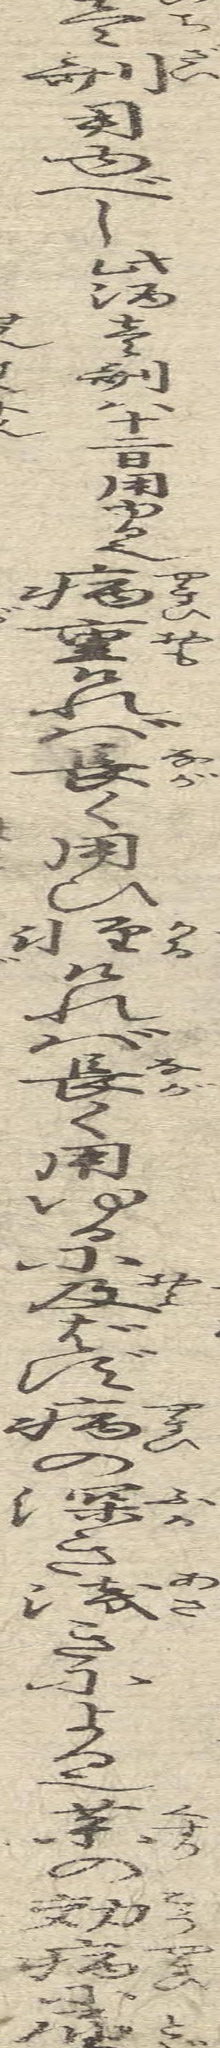壱剤用ゆべし此酒壱剤は十二日用ゆる也病重ければ長く用ひ軽ければ長く用ゆるに及ばず病の深き浅きによる也薬の効病に届
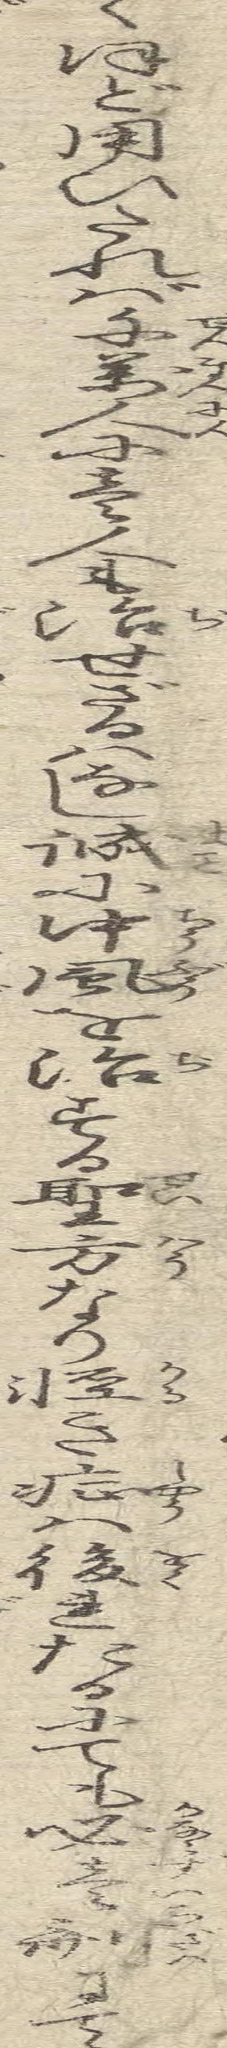くほど用ひたれば千万人に壱人も治せざるはなし誠に中風を治する聖方なり軽き症は後れたるにても必壱剤にて
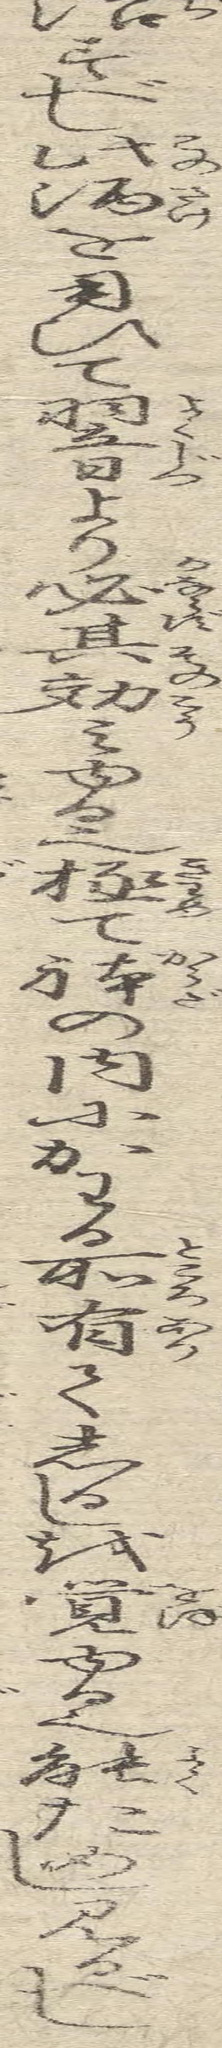治すべし此酒を用ひて翌日より必其効みゆる也極て体の内にかわる所有てしるしを覚ゆる也能ためし見るべし
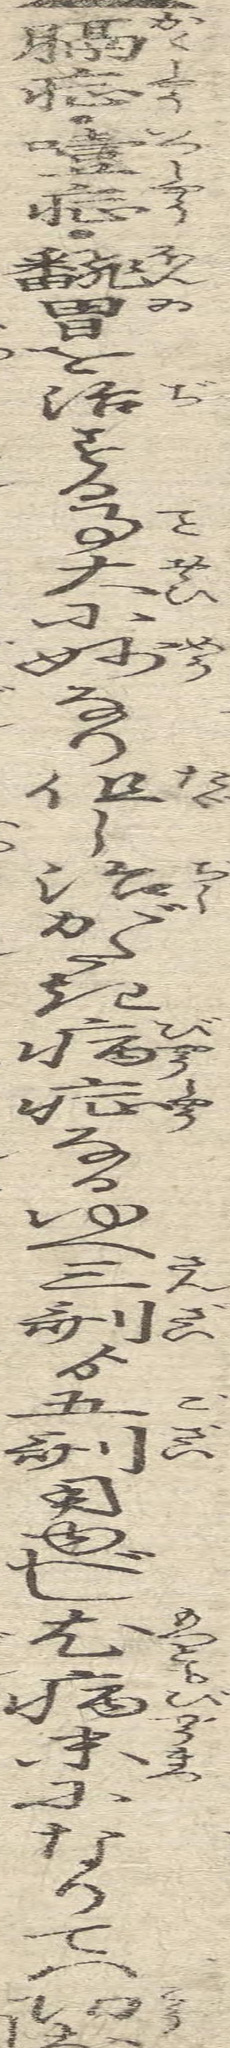▲膈症・噎症・翻胃を治する事大に妙なり但し治がたき病症なるゆへ三剤より五剤用ゆべし尤病末になりては功なし
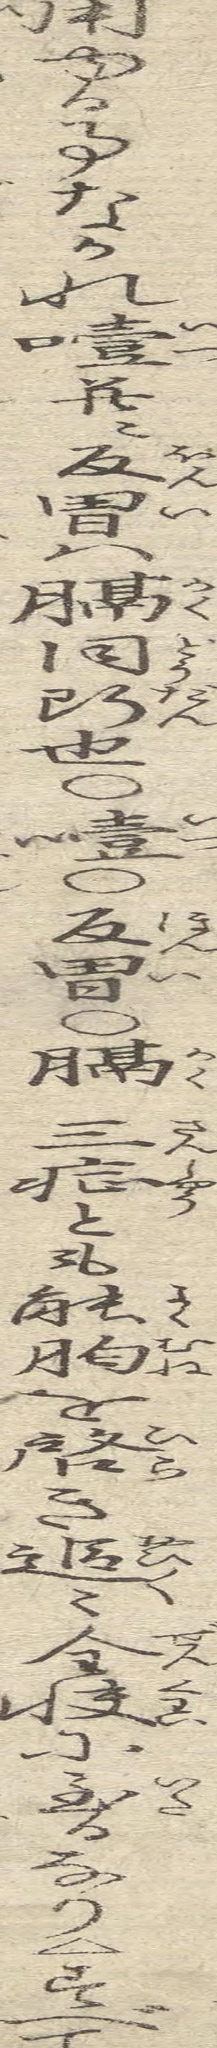用ゆる事なかれ噎并に反胃は膈同断也○噎○反胃○膈三症とも能胸を啓き追々全快に至るなり△すべて
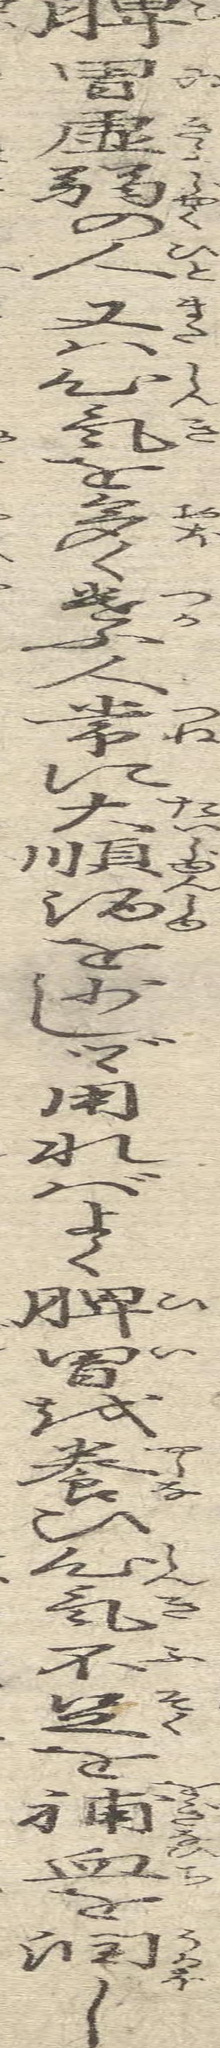脾胃虚弱の人又は心気を多く遣ふ人常に大順酒を少しづゝ用ればよく脾胃を養ひ心気不足を補血を潤し
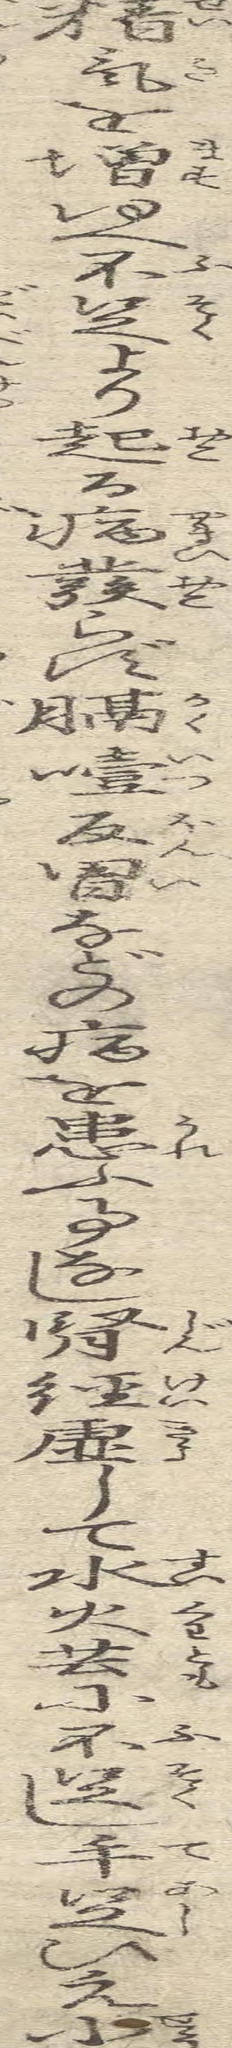精気を増ゆへ不足より起る病発らず膈噎反胃などの病を患ふ事なし腎経虚して水火共に不足し手足ひえ小
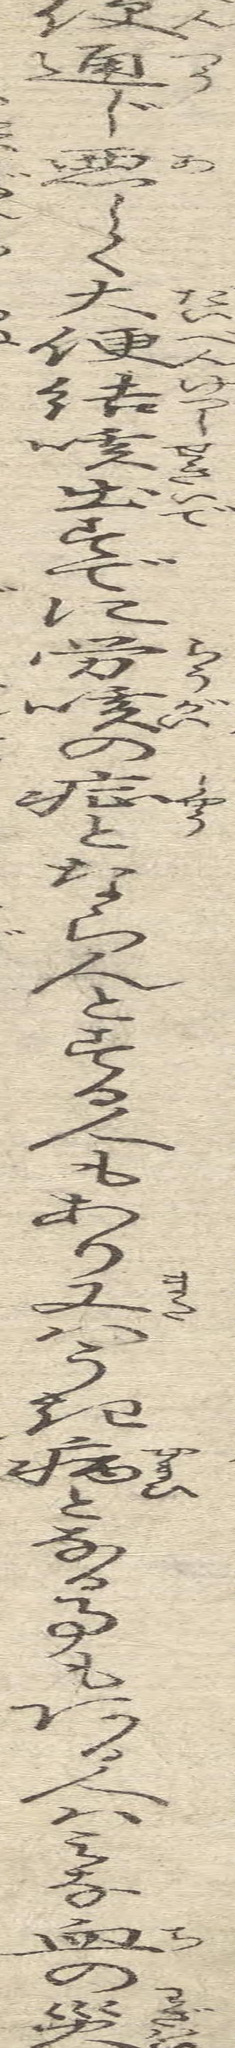便通じ悪しく大便結咳出すでに労咳の症とならんとする人もあり又はうき病となる事もある人はみな血の災
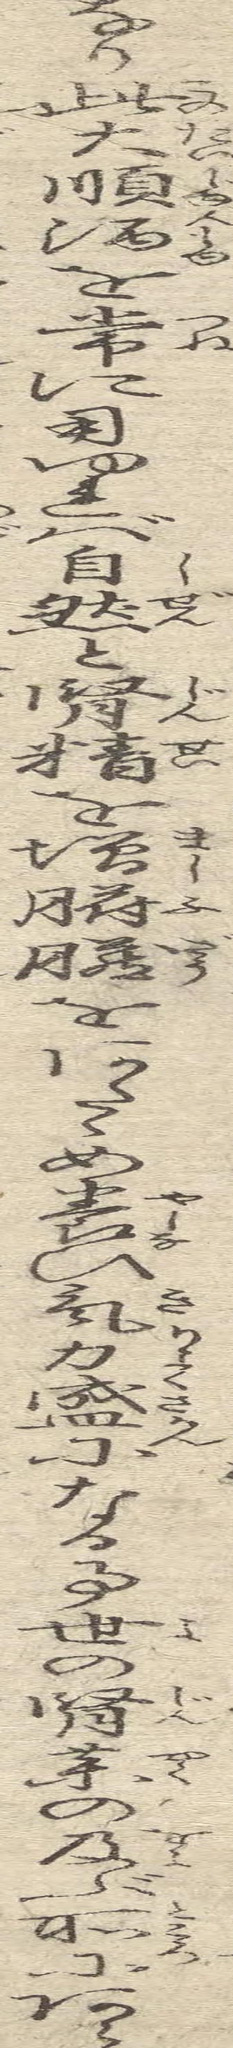なり此大順酒を常に用ゆれば自然と腎精を増腑臓をあたゝめ養ひ気力盛になる事世の腎薬の及ぶ所にあら
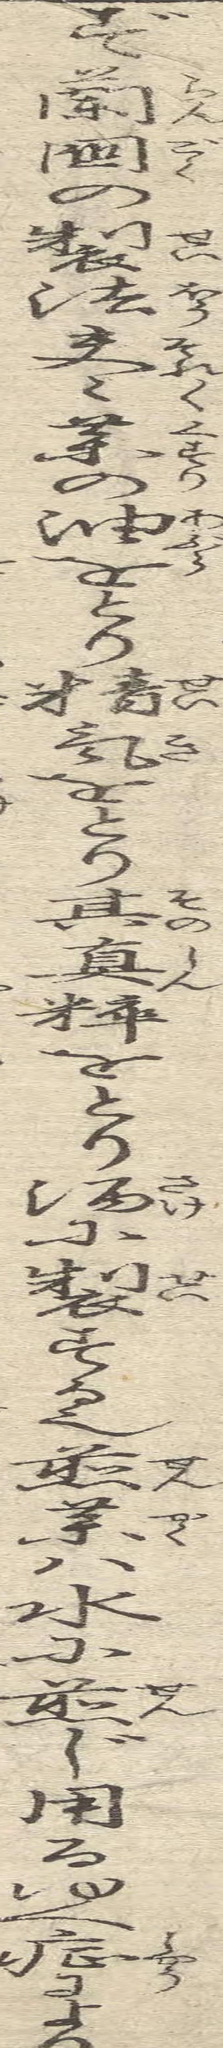ず蘭国の製法夫々薬の油をとり清気をとり其真粋をとり酒に製する也煎薬は水に煎じ用るゆへ症により
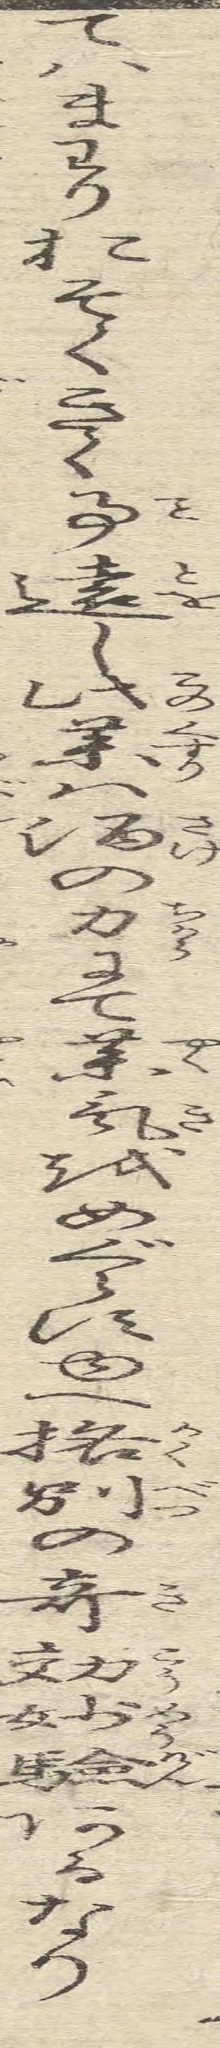てはまわりおそくきく事遠し此薬は酒の力にて薬気をめぐらすゆへ格別の奇効妙験あるなり
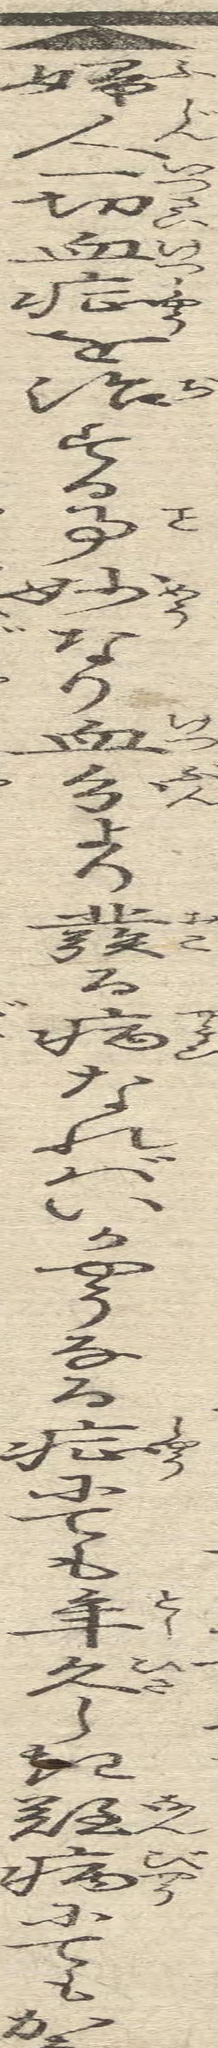▲婦人一切血症を治する事妙なり血分より発る病なればいかやうなる症にても年久しき難病にてもかなら
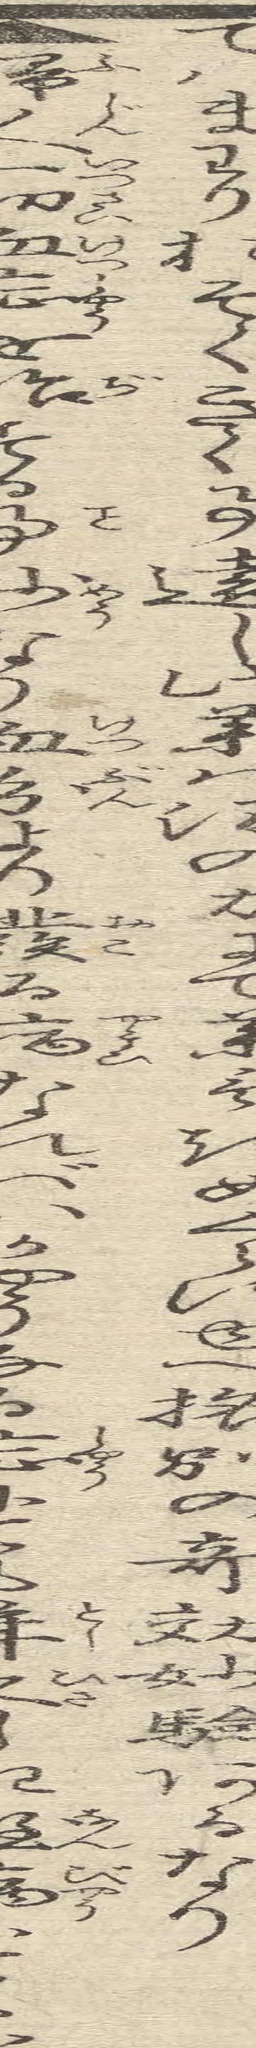▲婦人一切血症を治する事妙なり血分より発る病なればいかやうなる症にても年久しき難病にてもかなら
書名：浪華薬種問屋能書張交帖. 一
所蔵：国立国会図書館 National Diet Library, JAPAN
